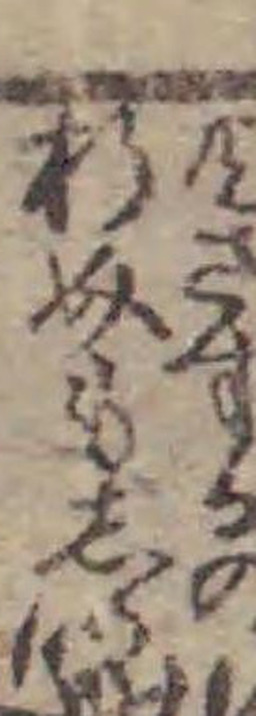折介もしら
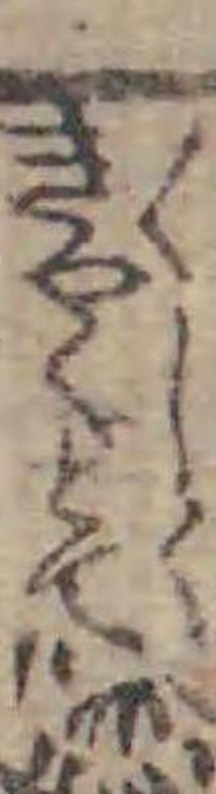きやくとて
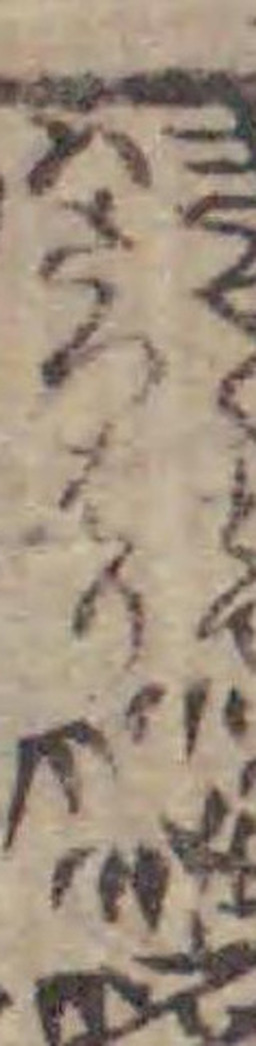はさつはり
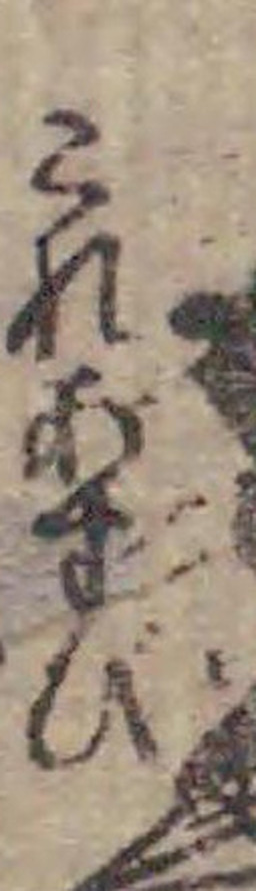これあすび
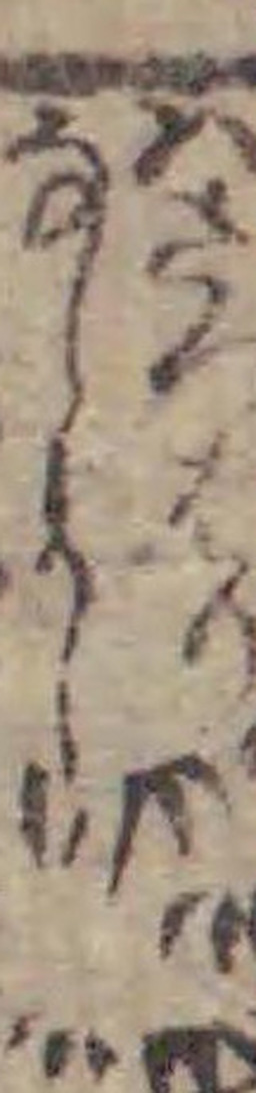なしよし
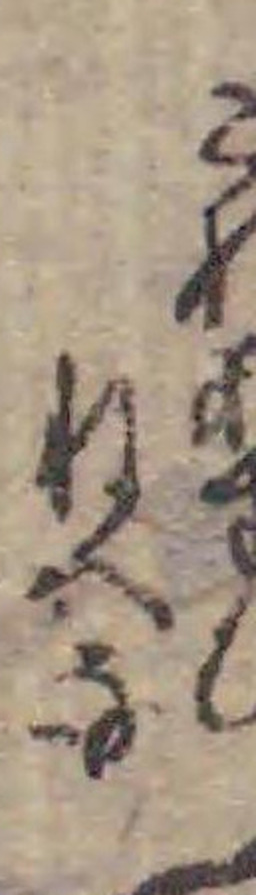ねへな
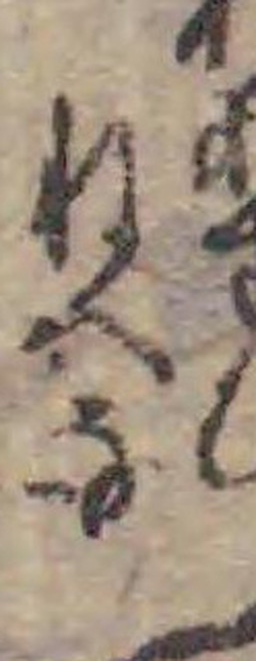ねへな
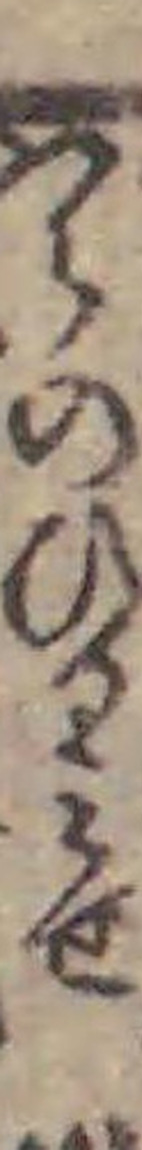はらのひるみせ
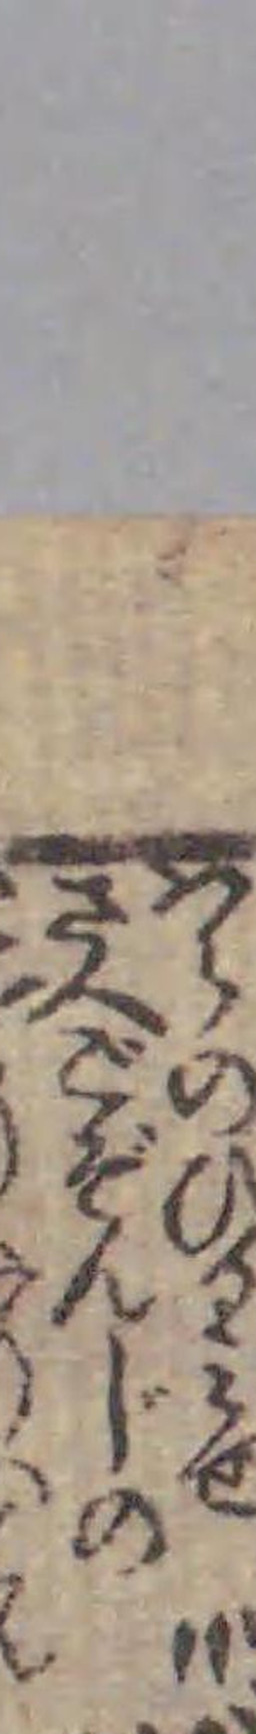さへごぞんじの
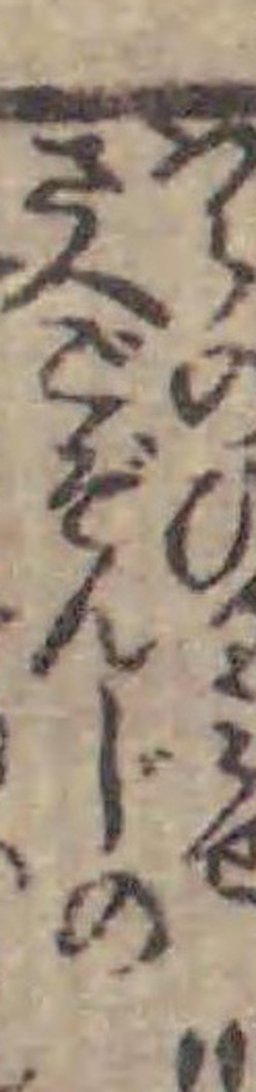さへごぞんじの
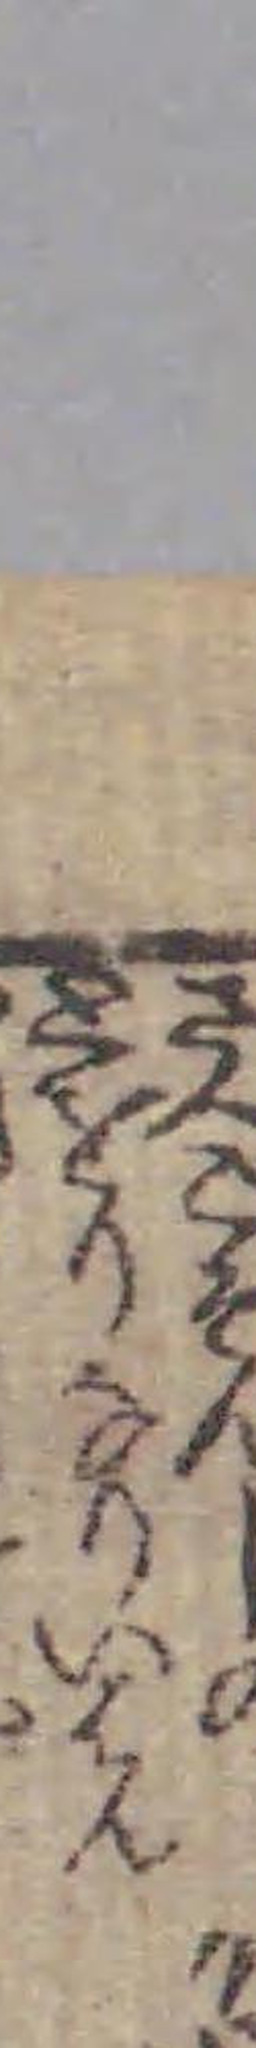とをりなりいはん
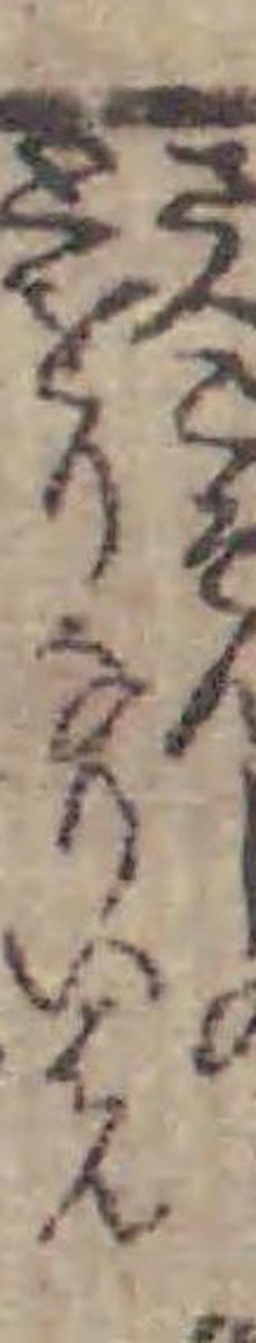とをりなりいはん
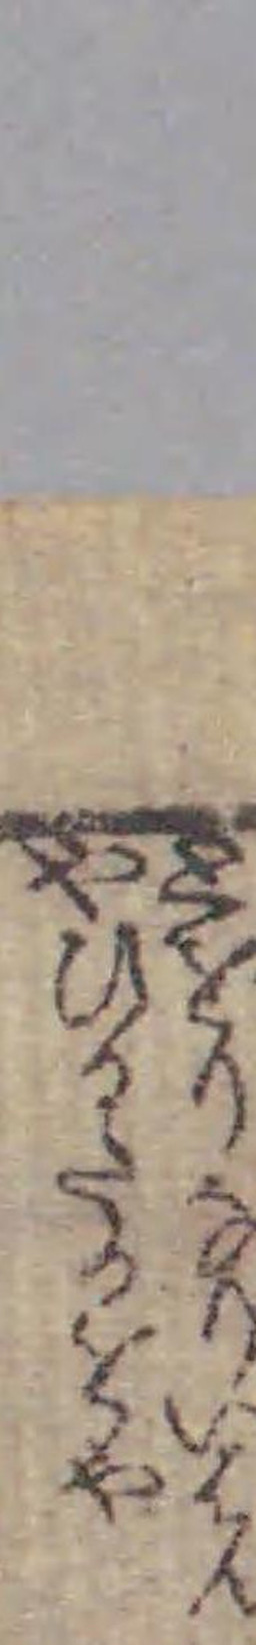やひるたかをや
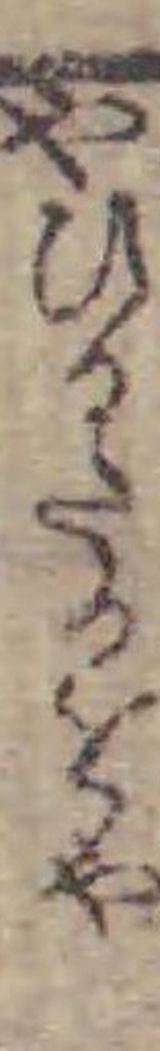やひるたかをや
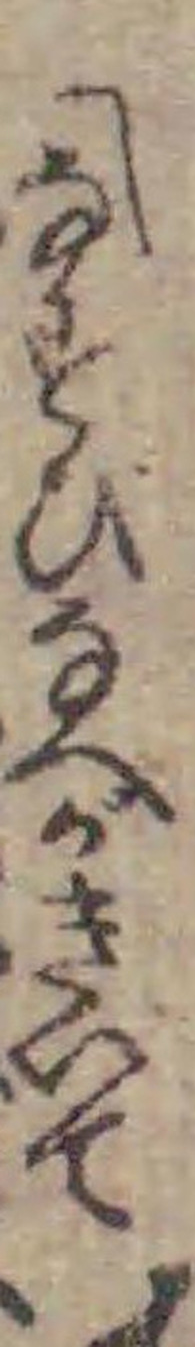〽なすびなへがきいて
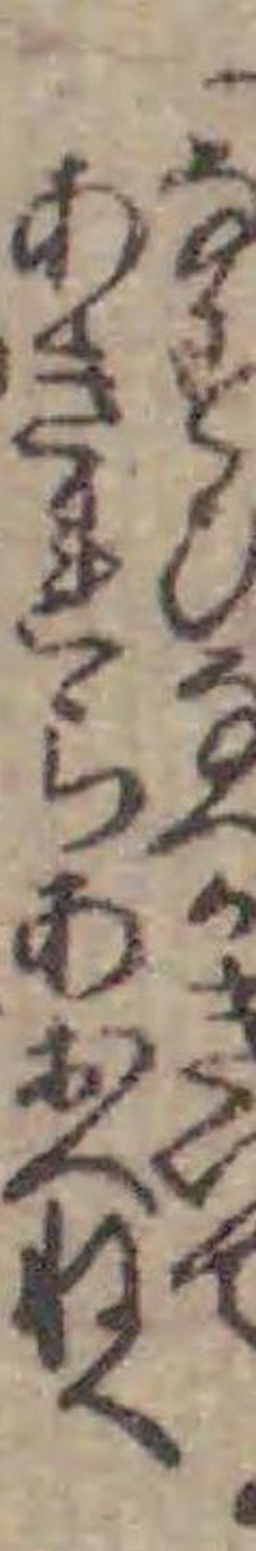あきれらあおへねへ
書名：本樹真猿浮気噺 : 3巻
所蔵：国立国会図書館 National Diet Library, JAPAN
